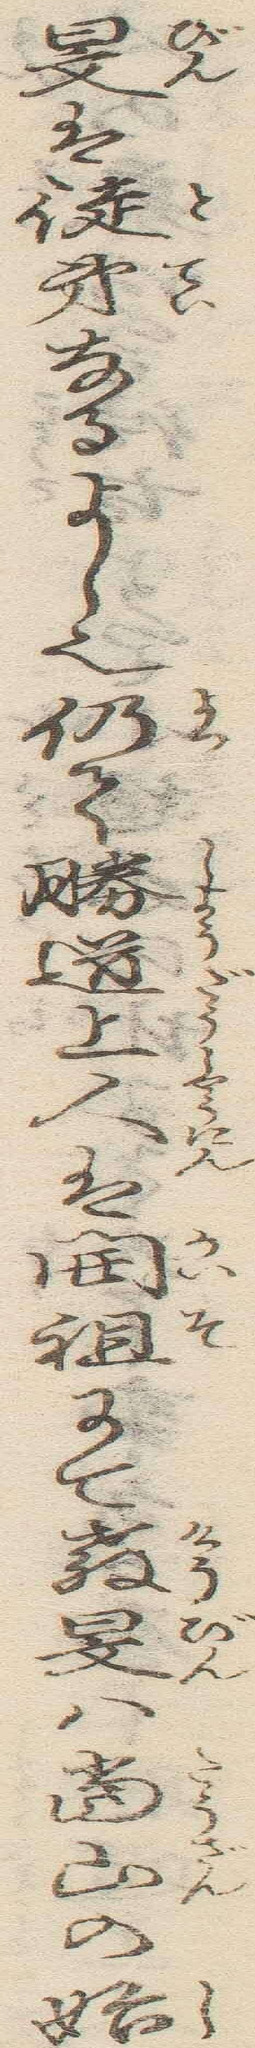旻は徒㐧なるよし也仍て勝道上人は開祖にて敎旻は當山の始
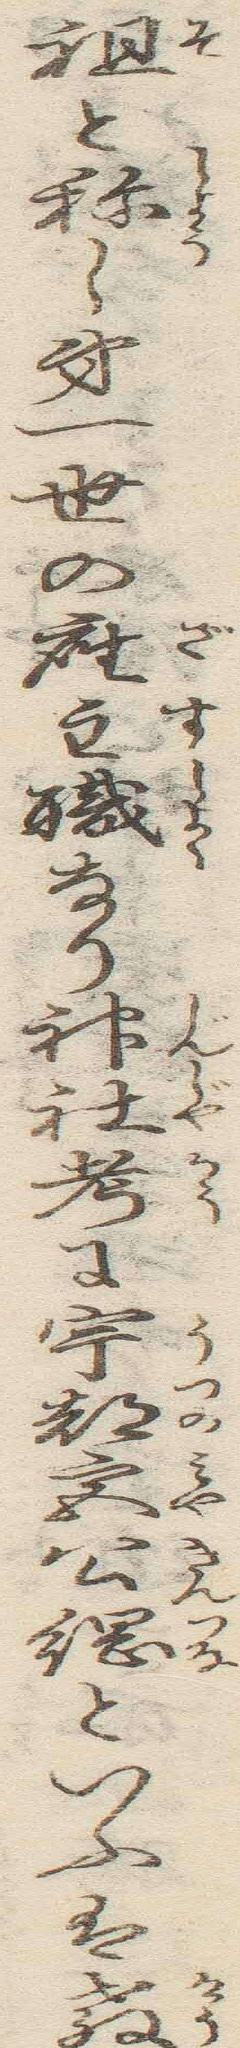祖と称し㐧一世の座主職なり神社考に宇都宮公綱といふは敎
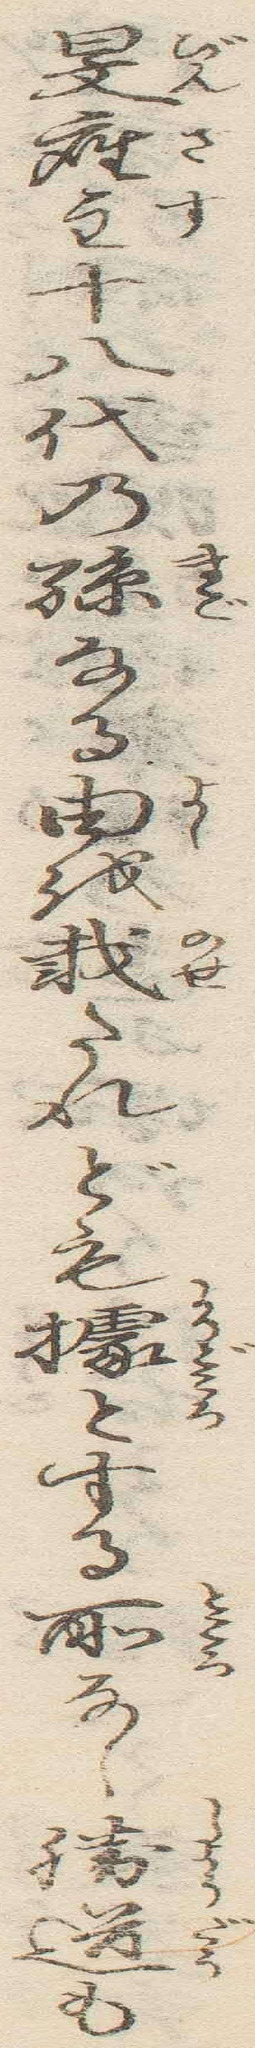旻座主十八代の孫なる由を載たれども據とする所なし勝道も
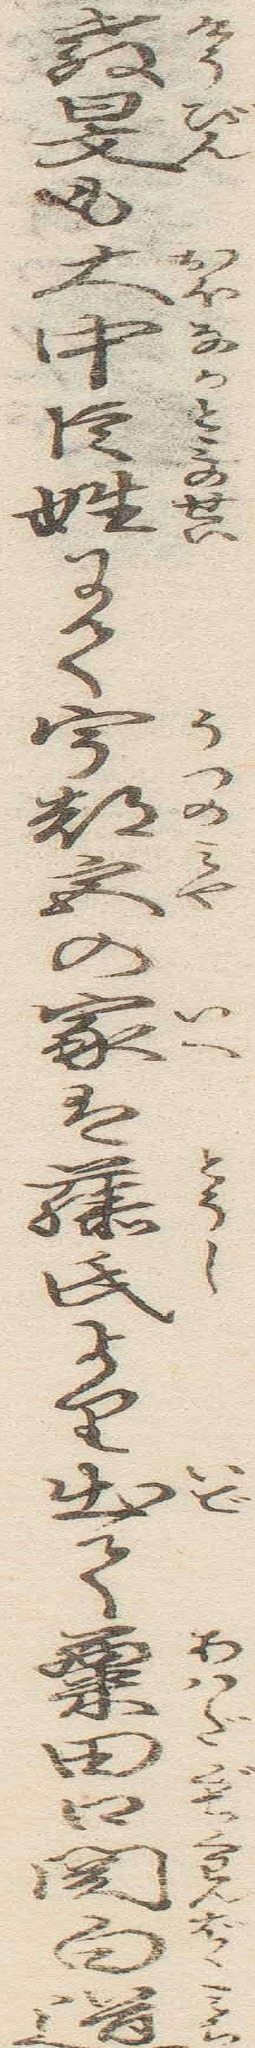敎旻も大中臣姓にて宇都宮の家は藤氏より出て粟田口関白道
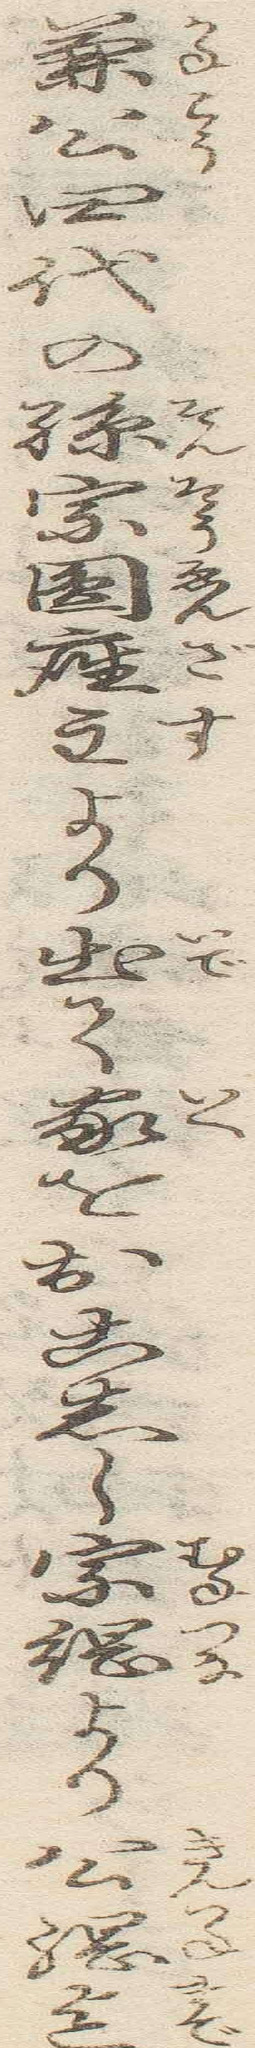兼公四代の孫宗圓座主より出て家をおこしし宗綱より公綱迄
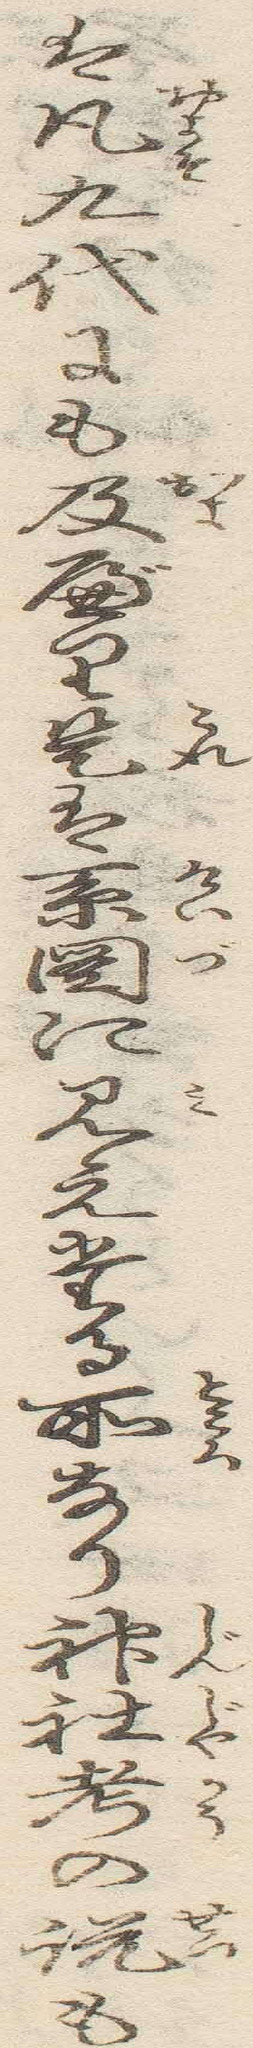は凡九代にも及べり是は系圖に見えたる所なり神社考の説も
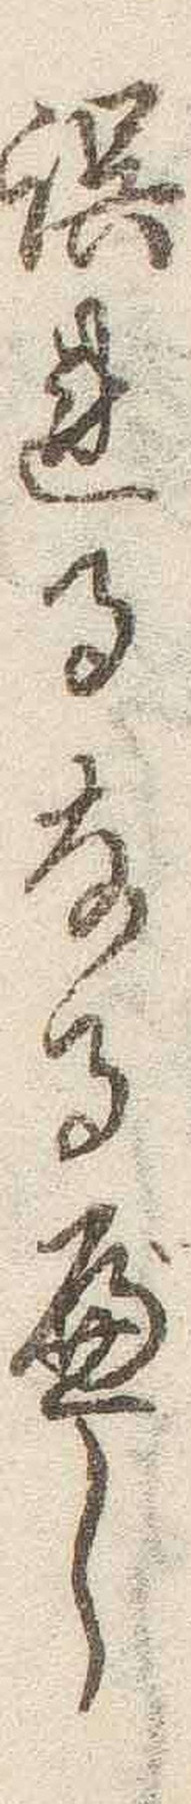誤れるなるべし
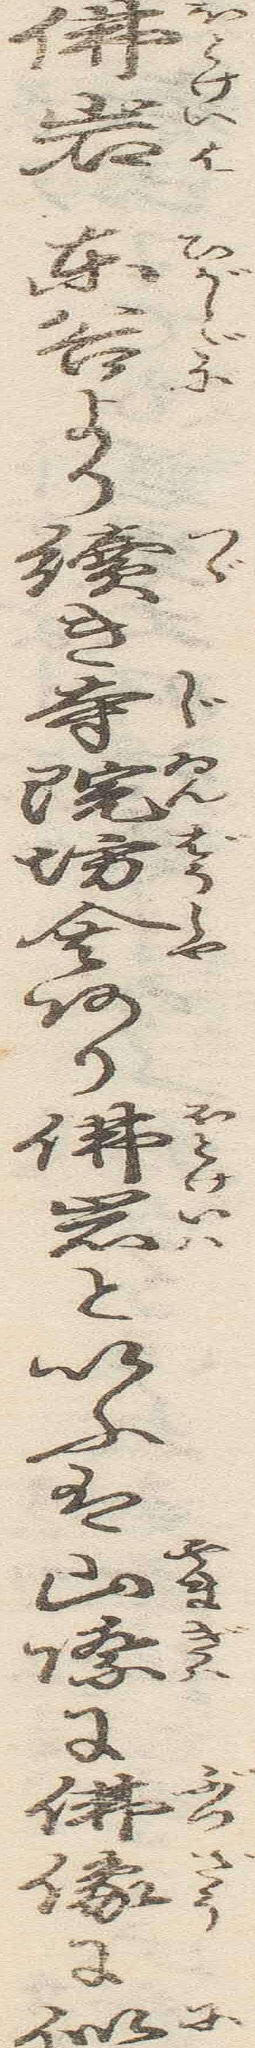佛岩東谷より續き寺院坊舎あり佛岩といふは山際に佛像に似
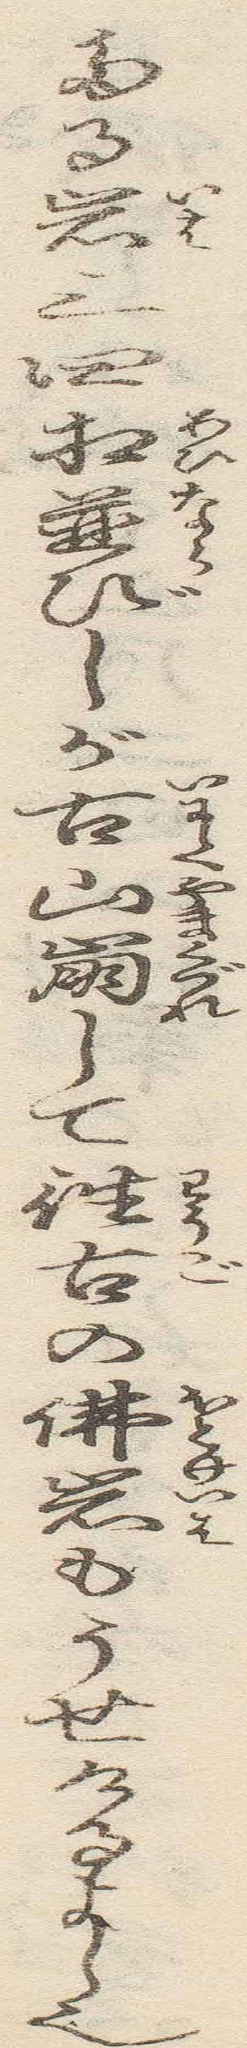たる岩三四相並びしが古山崩して徃古の佛岩もうせけるよし也
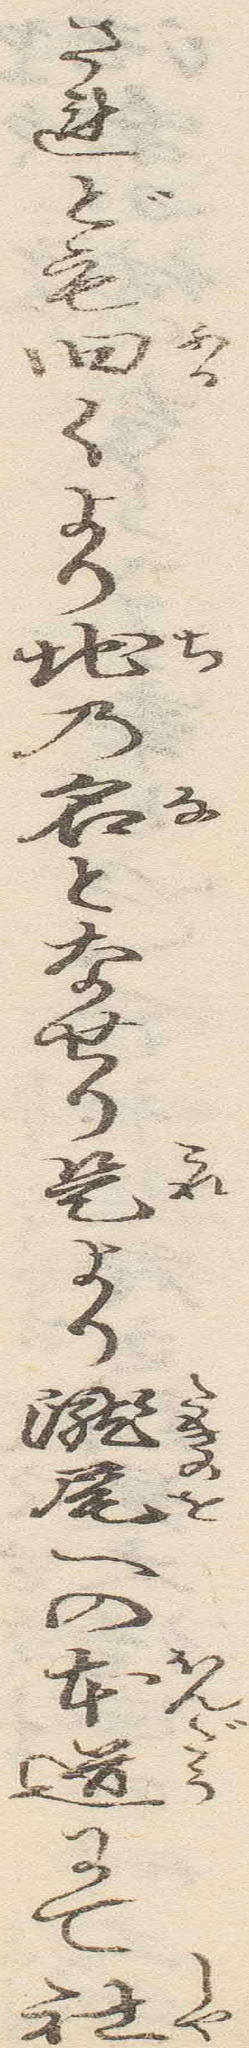されども旧くより地の名となせり是より瀧尾への本道にて社
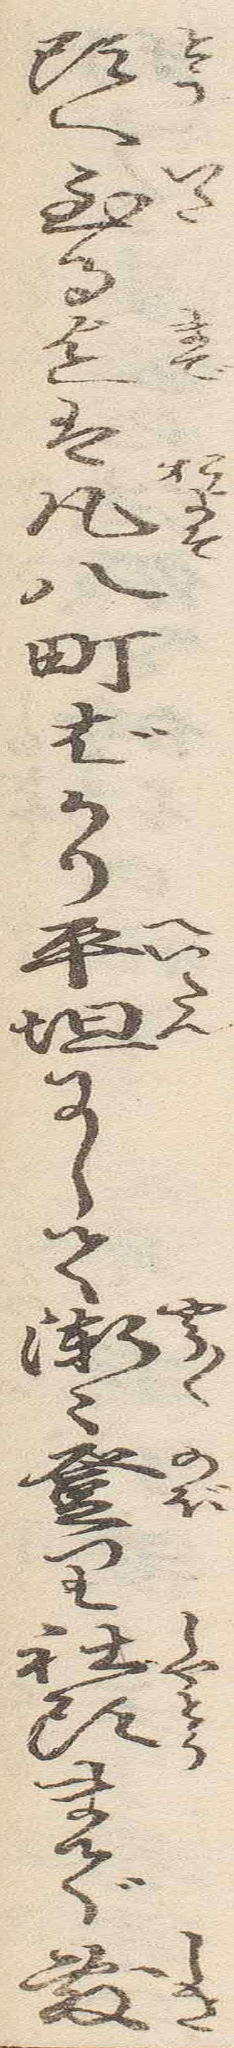頭へ至る迄は凡八町ばかり平坦にして漸〻登り社頭まで敷
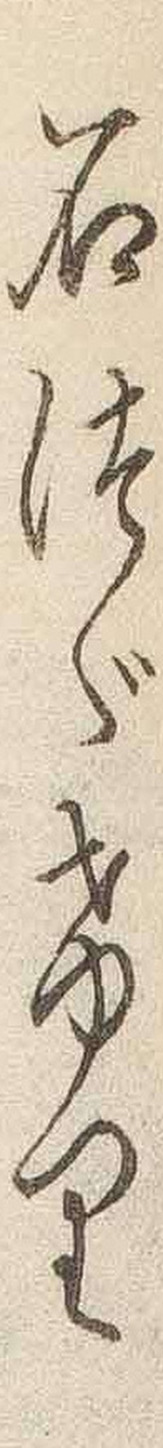石つゞけり
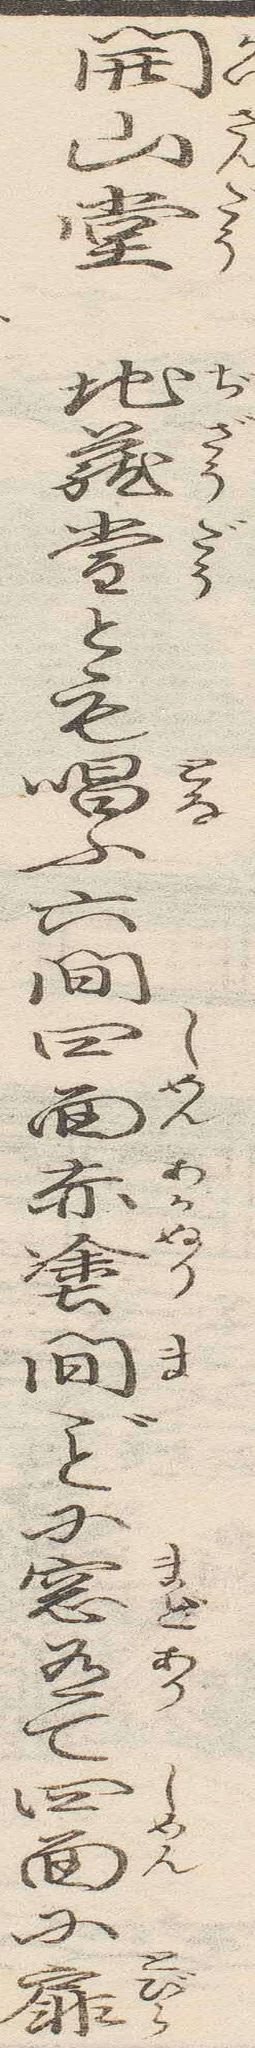開山堂地蔵堂とも唱ふ六間四面赤塗間ごとに窓有て四面に扉
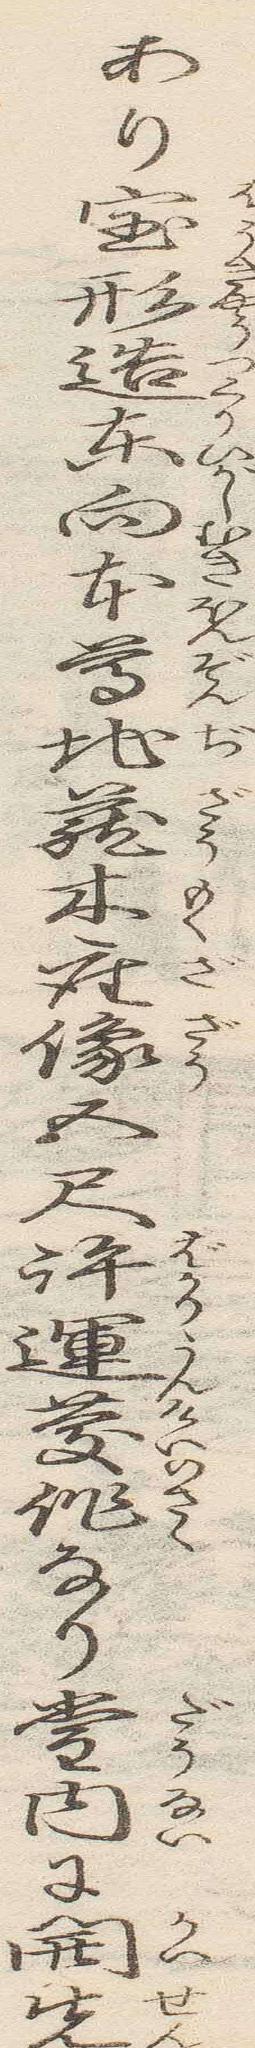あり宝形造東向本尊地蔵木座像五尺許運慶作なり堂内に開先
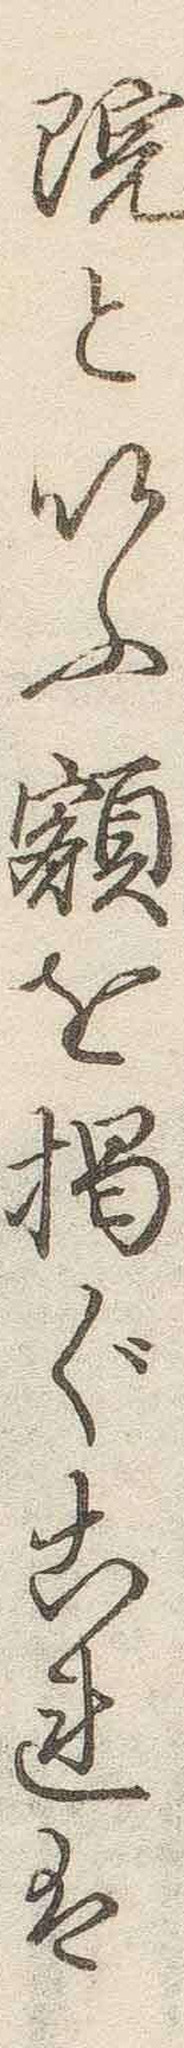院といふ額を掲ぐこれは
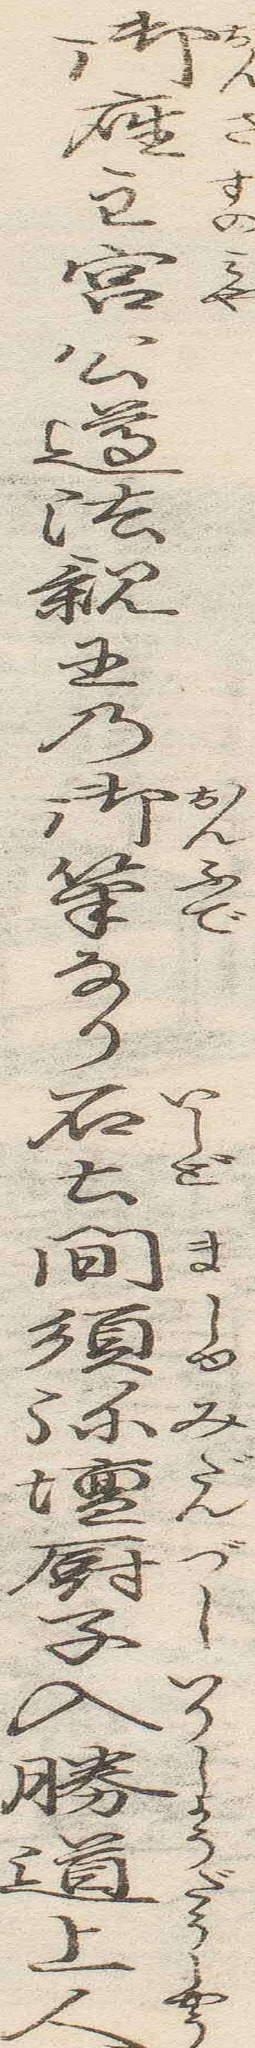御座主宮公道法親王の御筆なり石土間須弥壇厨子入勝道上人
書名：日光山志
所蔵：東京学芸大学附属図書館 国文学研究資料館
